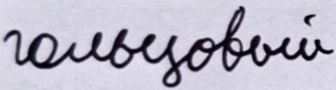гольцовый
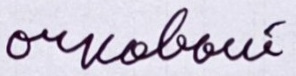очковый
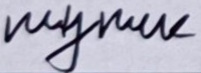тупик
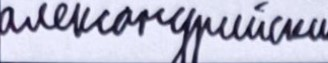александрийски
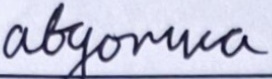авдотка
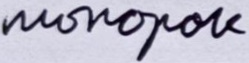топорок
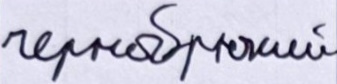чернобрюхий
